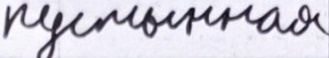пустынная
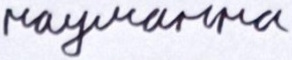науманна
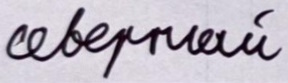северный
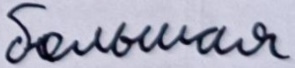большая
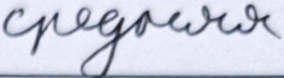средняя
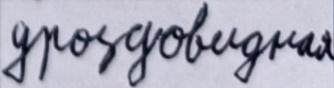дроздовидная
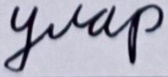улар
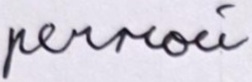речной
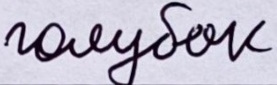голубок
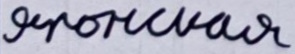японская
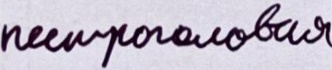пестроголовая
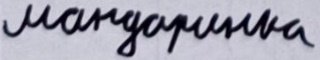мандаринка
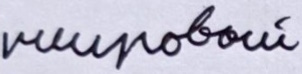тигровый
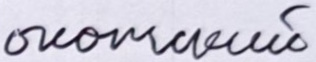охотский
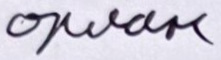орлан
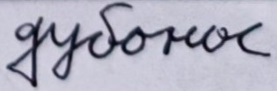дубонос
